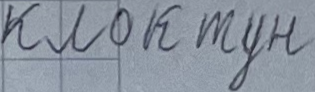клоктун
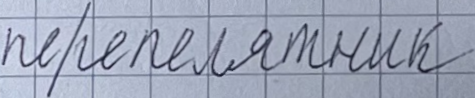перепелятник
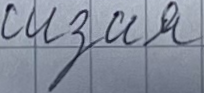сизая
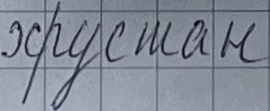хрустан
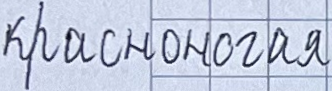красноногая
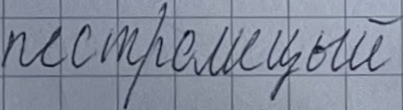пестролицый
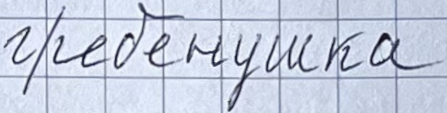гребенушка
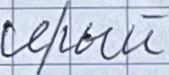серый
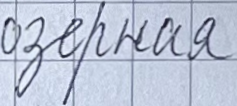озерная
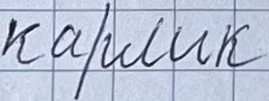карлик
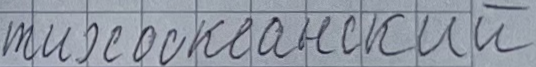тихоокеанский
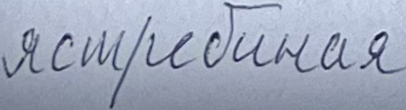ястребиная
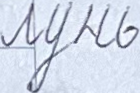лунь
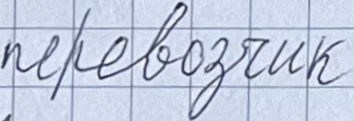перевозчик
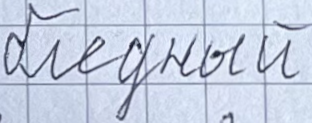бледный
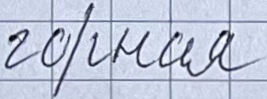горная
